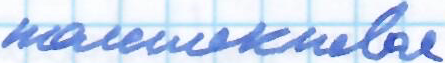толстоклювая
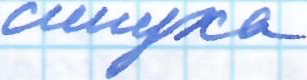сипуха
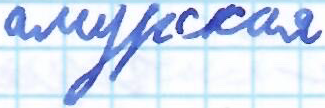амурская
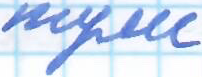тулес
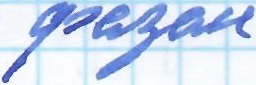фазан
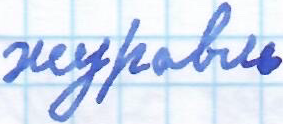журавль
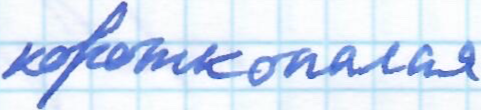короткопалая
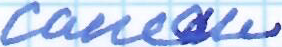сапсан
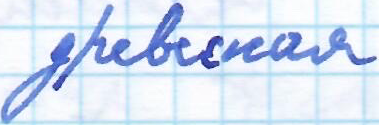древесная
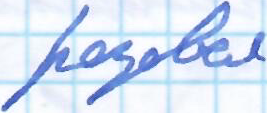розовая
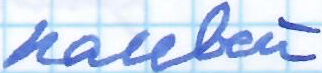полевой
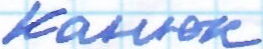канюк
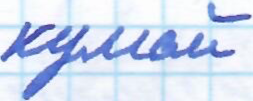кумай
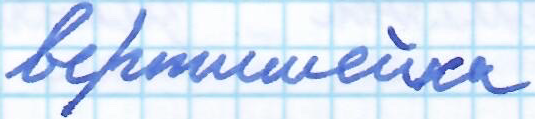вертишейка
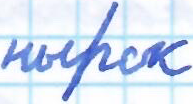нырок
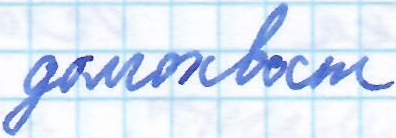долгохвост
